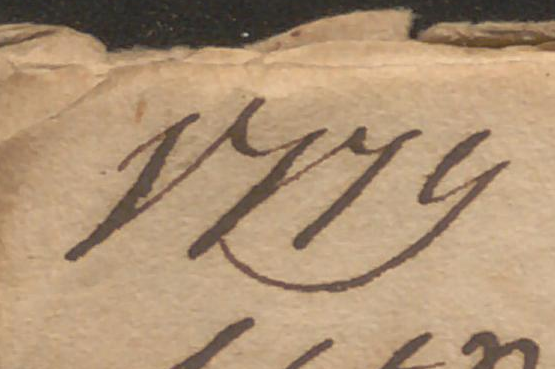1779
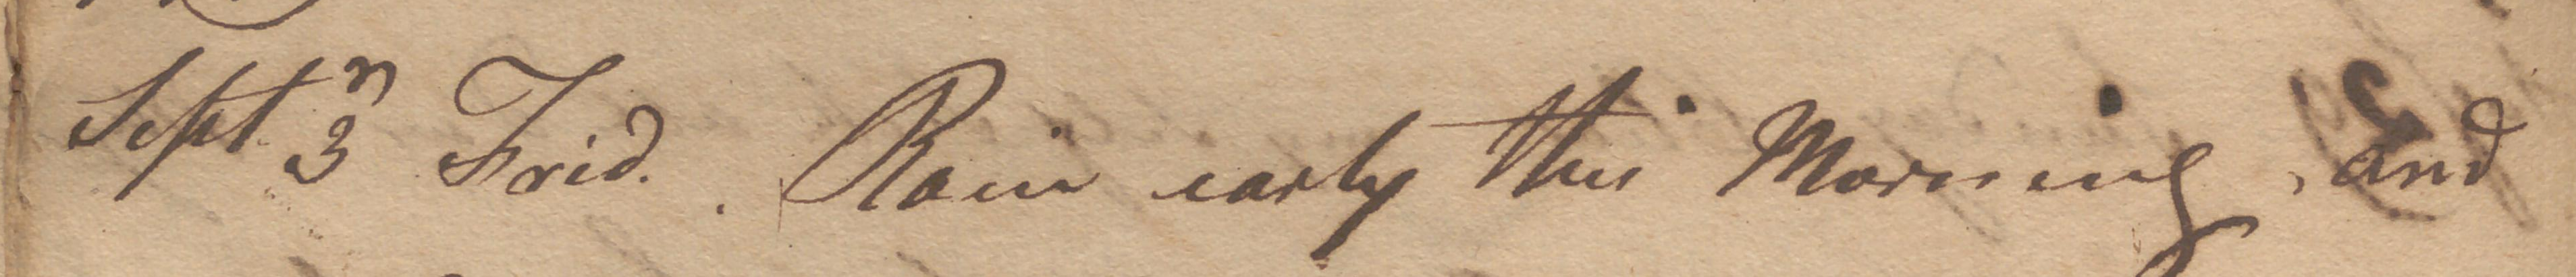Sept^r 3 Frid. Rain early this Morning and
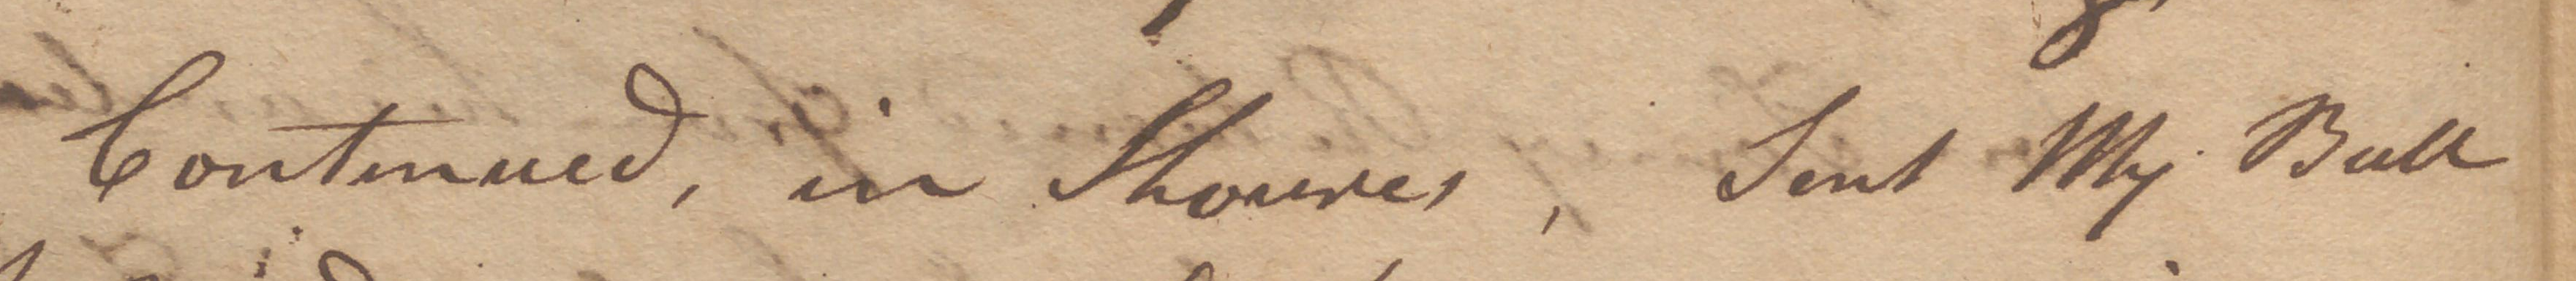Continued, in Shoures, Sent My Bull
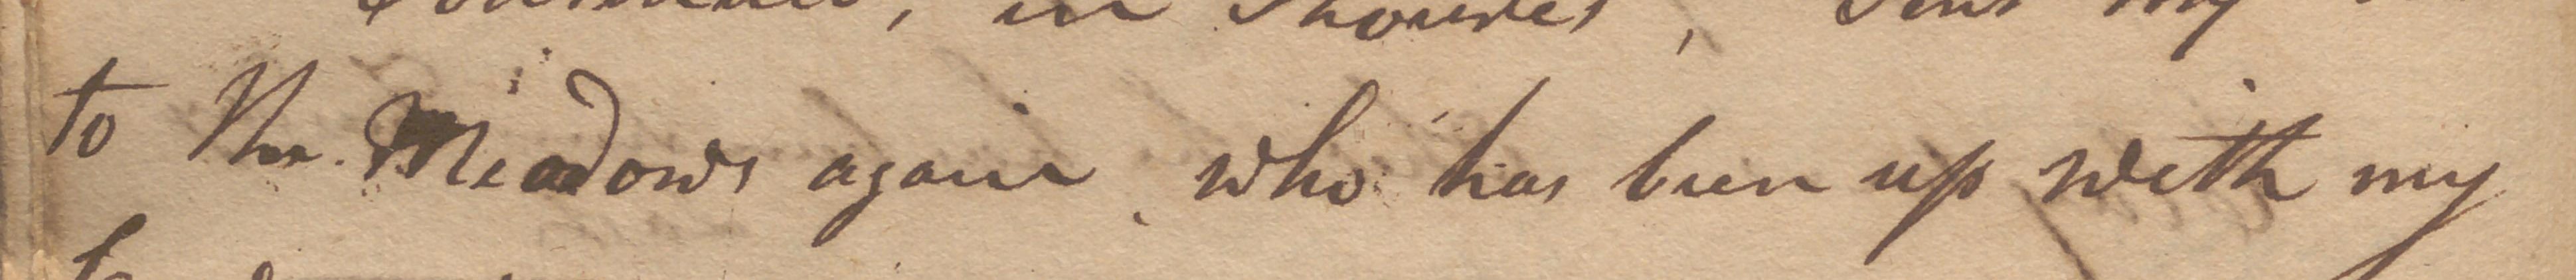to the Meddows again who has been up with my
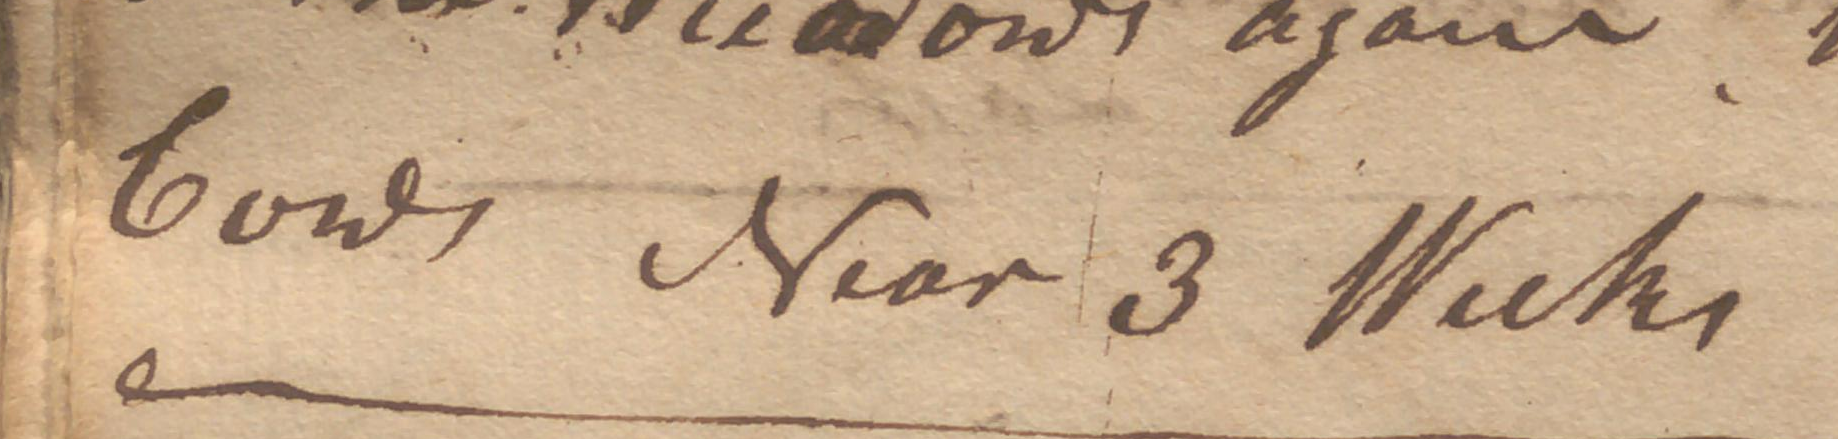Cows Near 3 Weeks
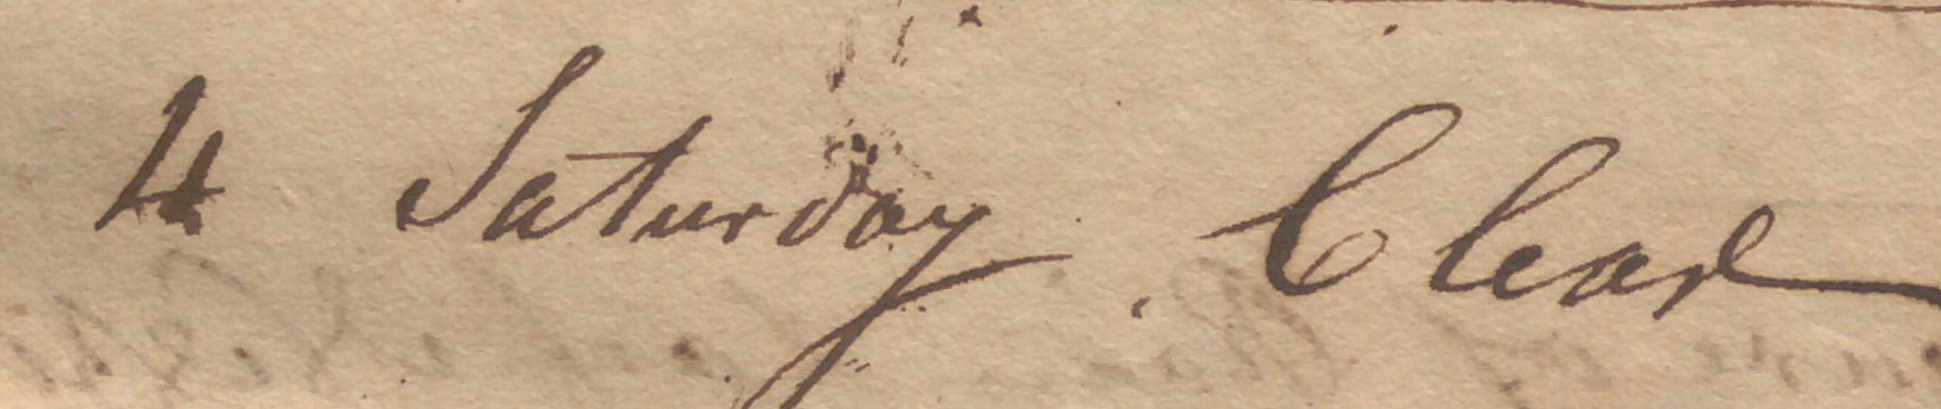4 Saturday Clear
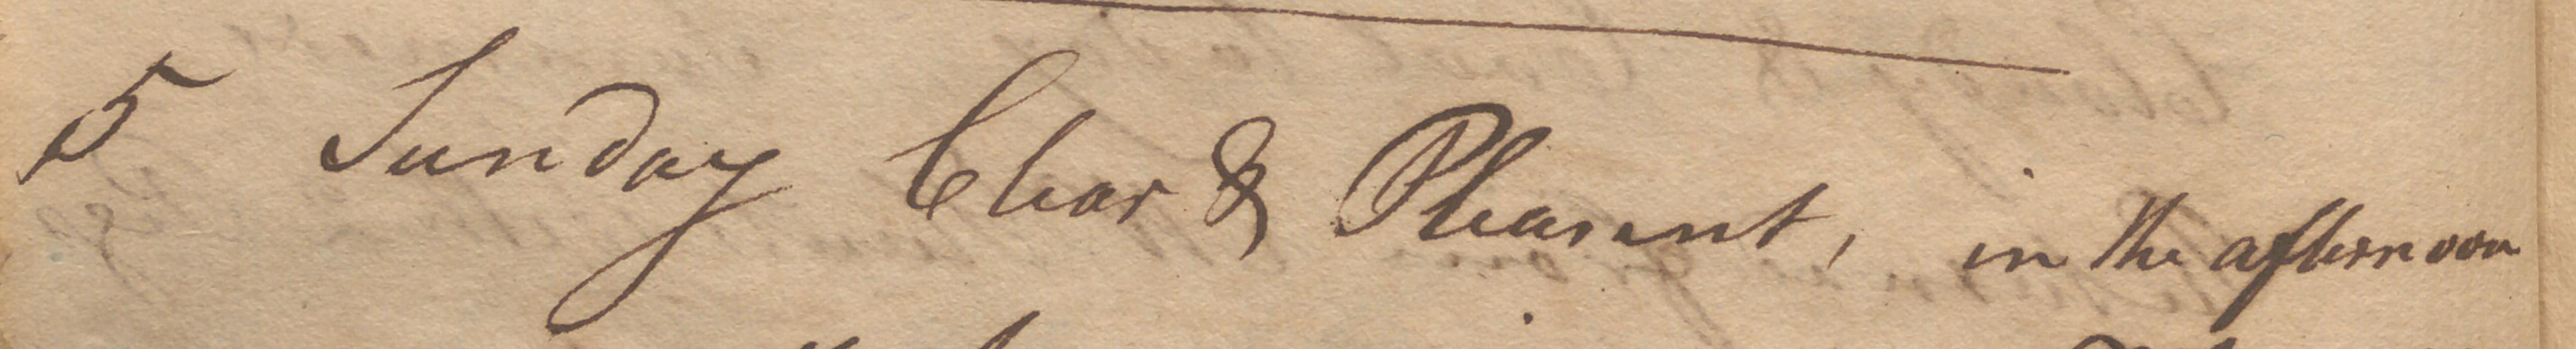5 Sunday Clear & Pleasent, in the afternoon
